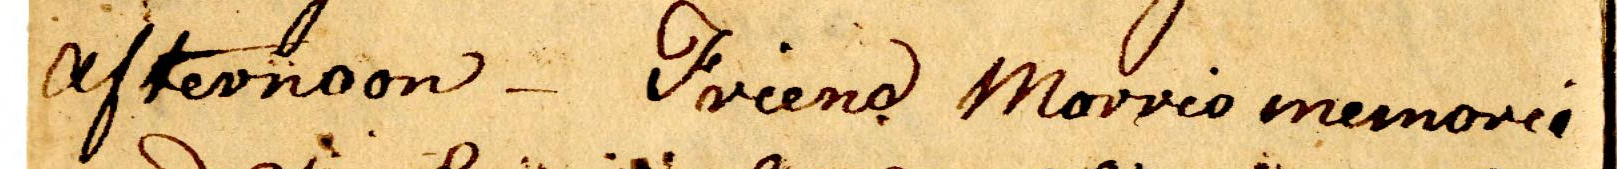Afternoon- Friend Morris memoris
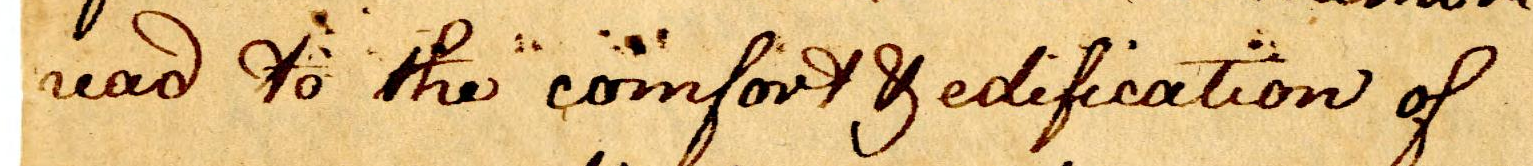read to the comfort & edification of
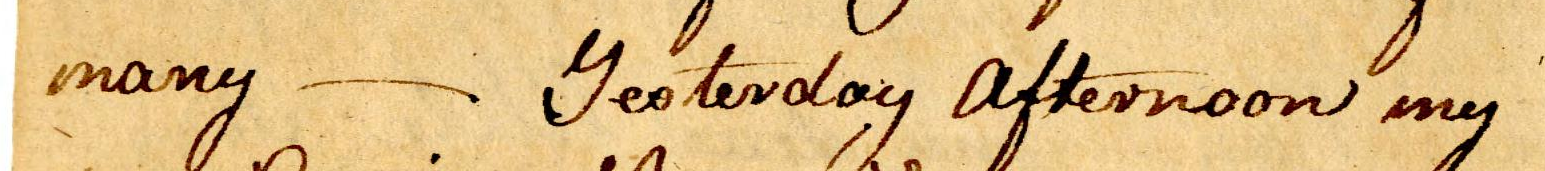many- Yesterday Afternoon my
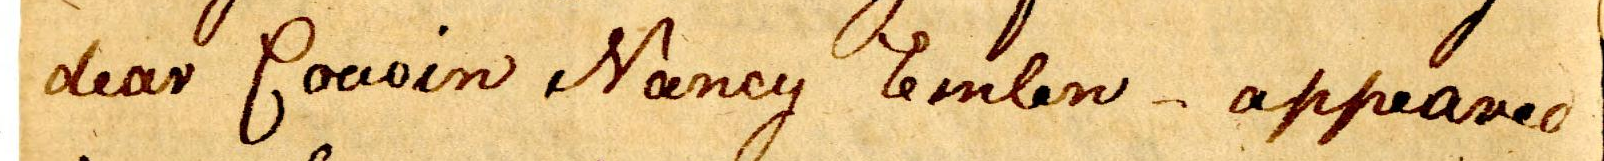dear Cousin Nancy Emlen- appeared
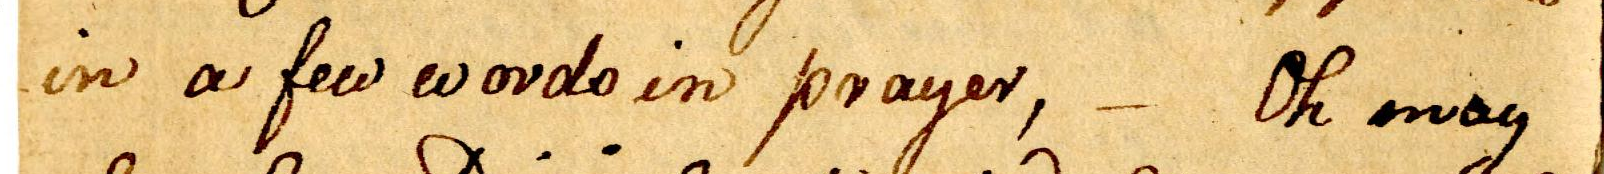in a few words in prayer,- Oh may
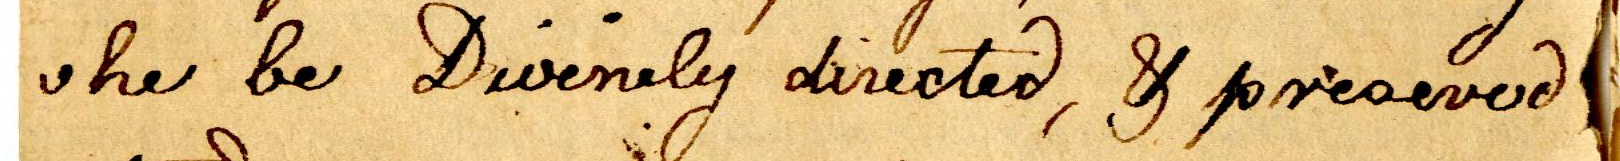she be Divinely directed, & preservd
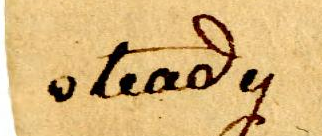steady-
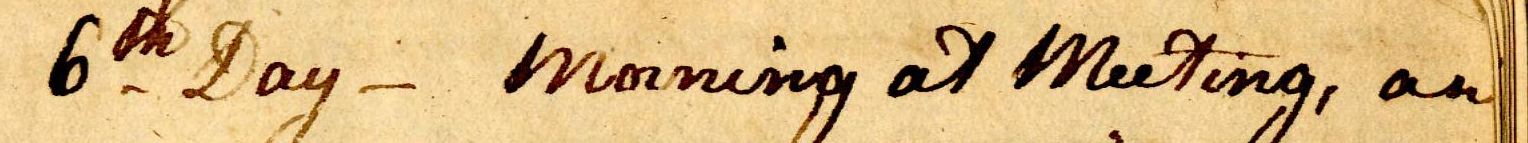6^th Day- Morning at Meeting, an
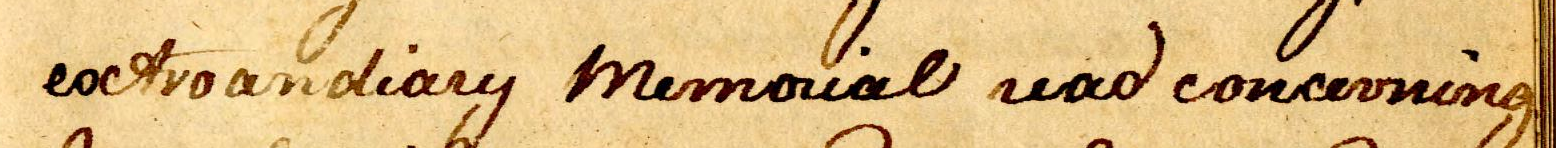extroandiary Memorial read concerning
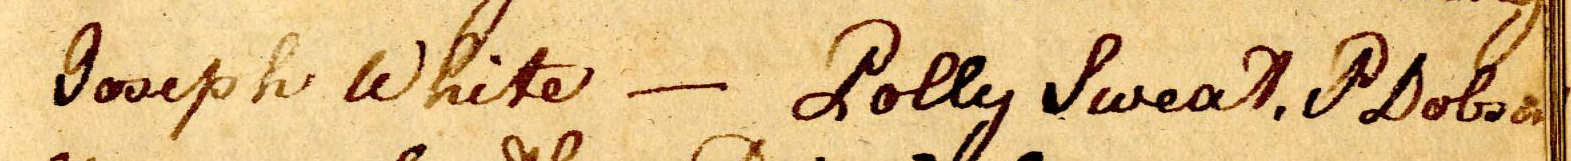Joseph White- Polly Sweat, P Dobso
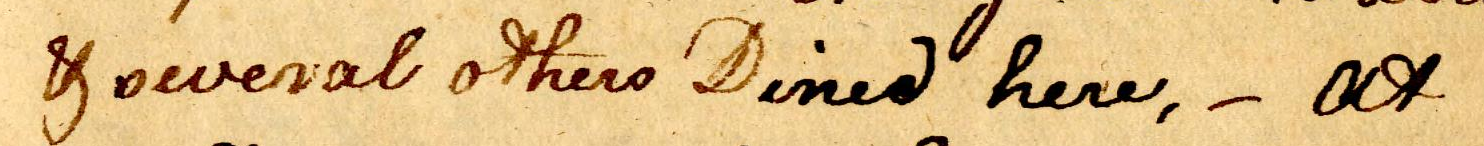& several others Dined here,- At
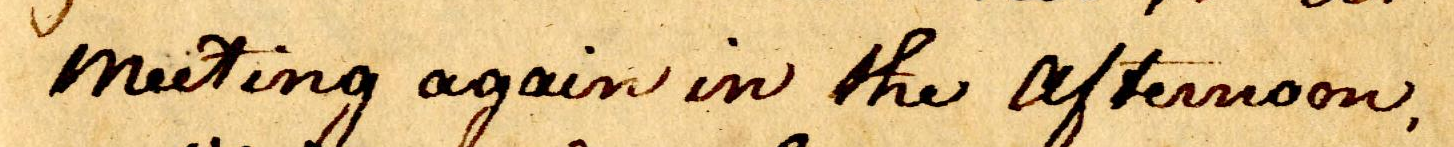Meeting again in the Afternoon,
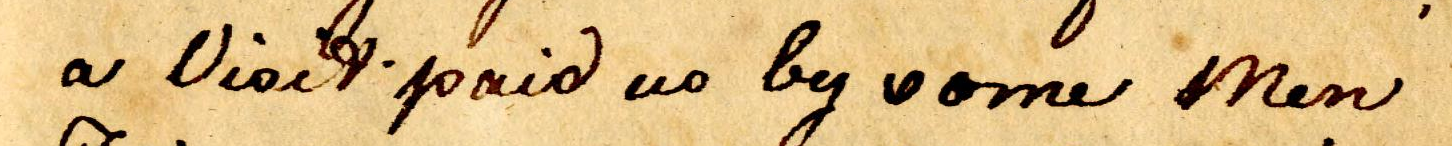a Visit paid us by some Men
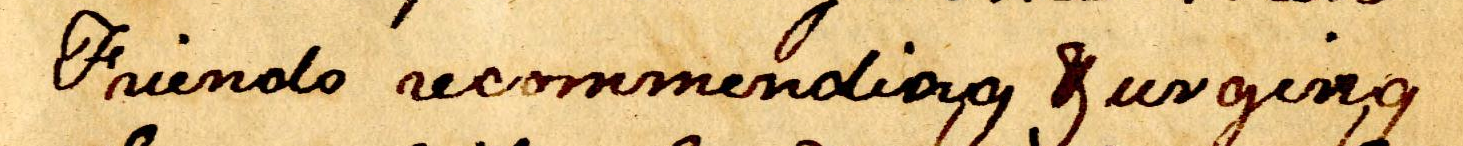Friends recommending & urging
